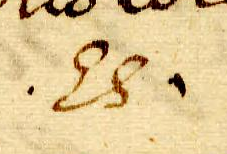.ES.
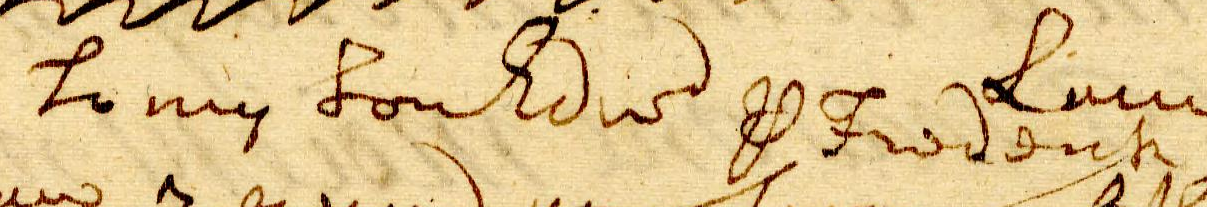to my Son Edw^d per Frederick
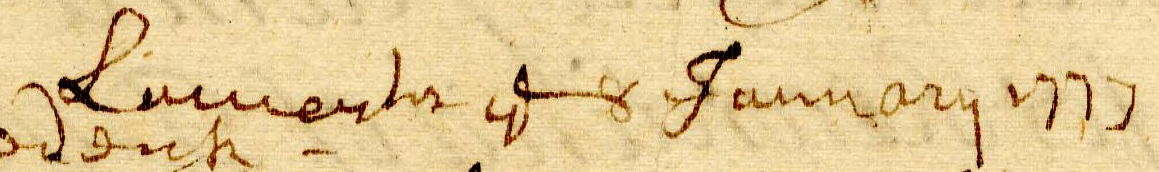Lancaster y^e 8 January 1777
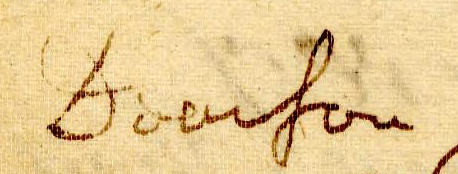Dear Son
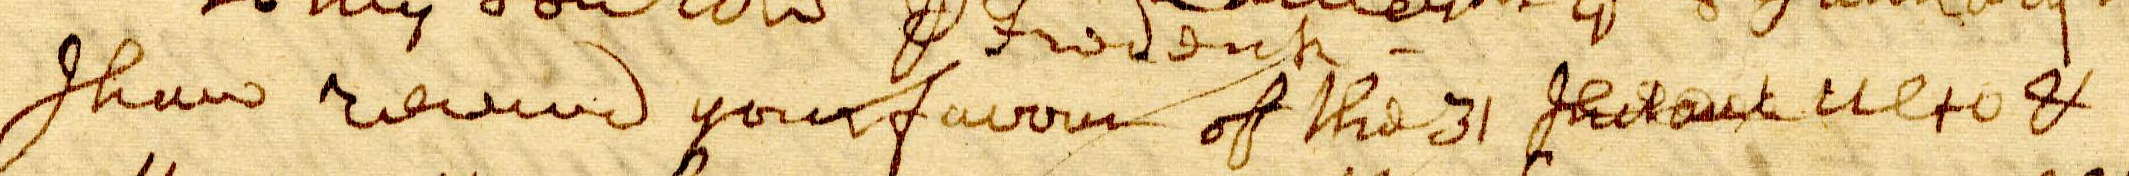I have received your favour of the 31 [instant] Ult^o &
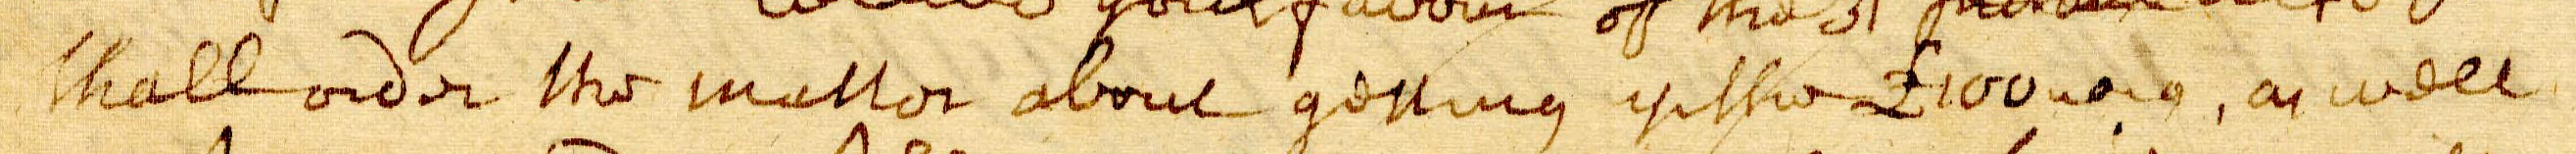Shall order the matter about getting y^e the £100, as well
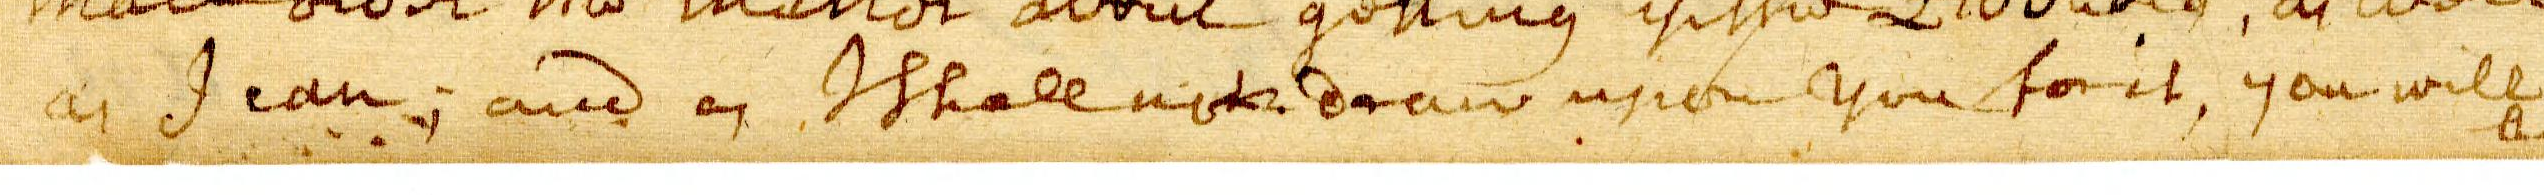as I can; and as I Shall withdraw upon you for it, you will
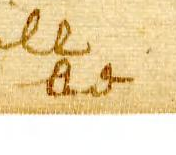be
